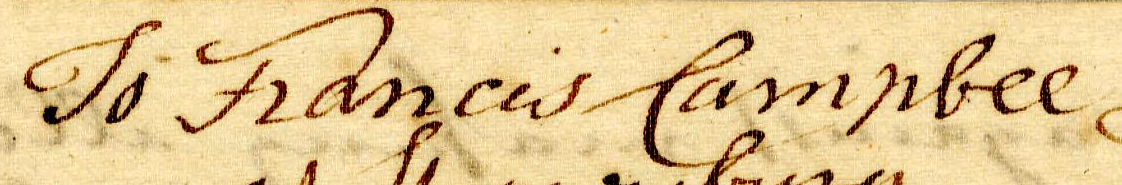To Francis Campbee
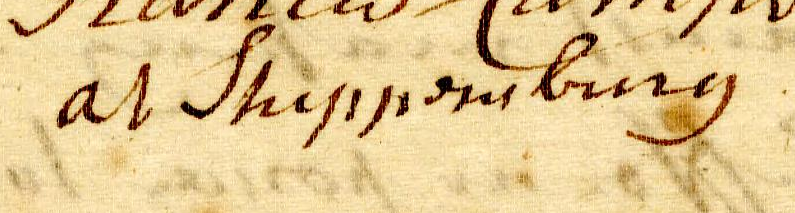at Shippensburg
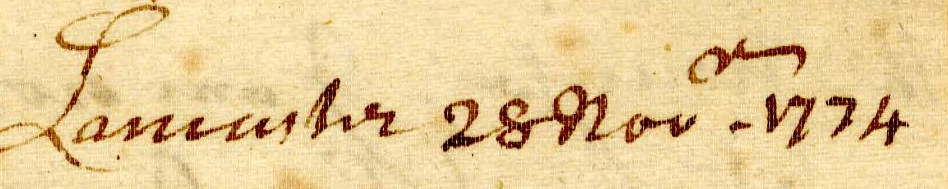Lancaster 28 Nov^r 1724
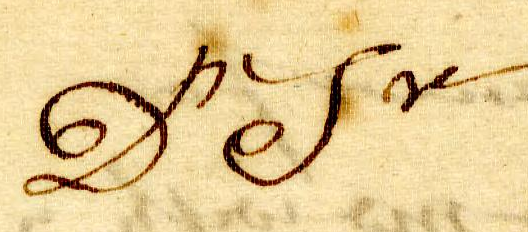D^r S^r
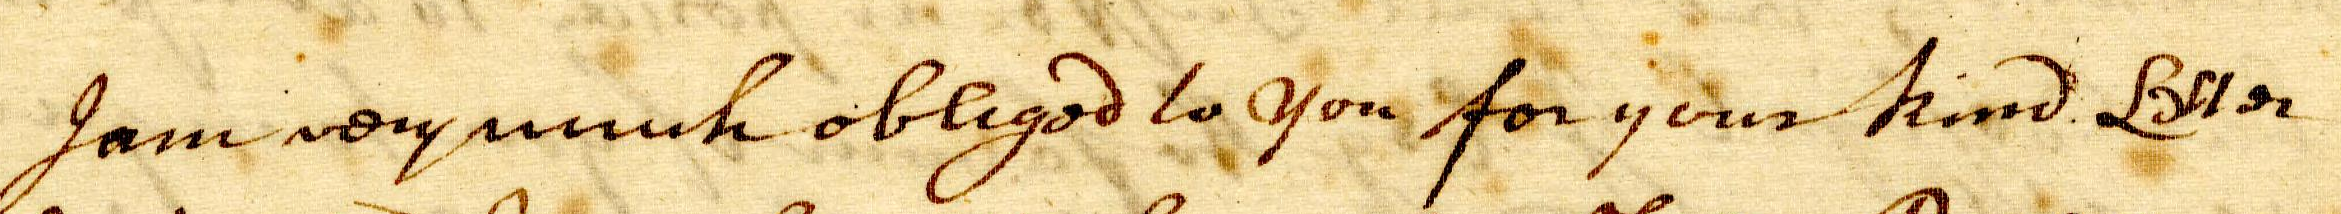I am very much obliged to you for your kind Letter
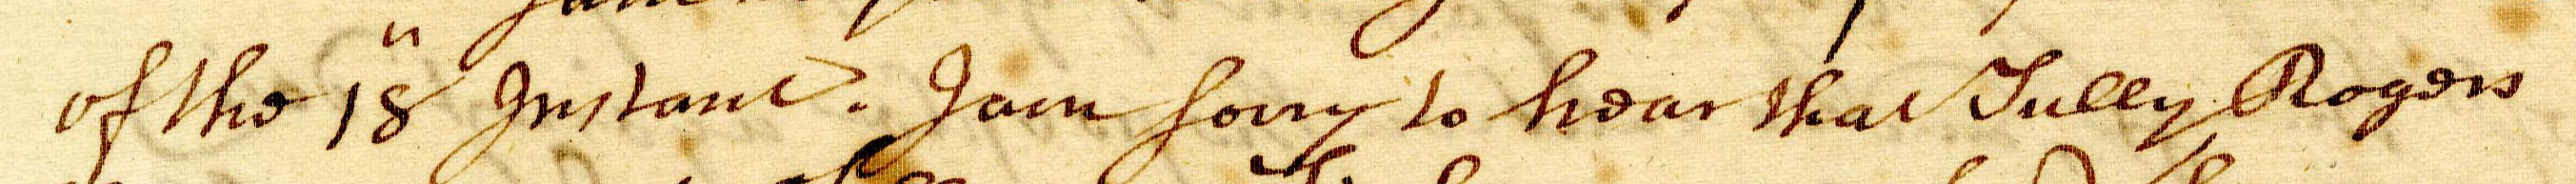of the 18 Instant. I am sorry to hear that Tully Rogers
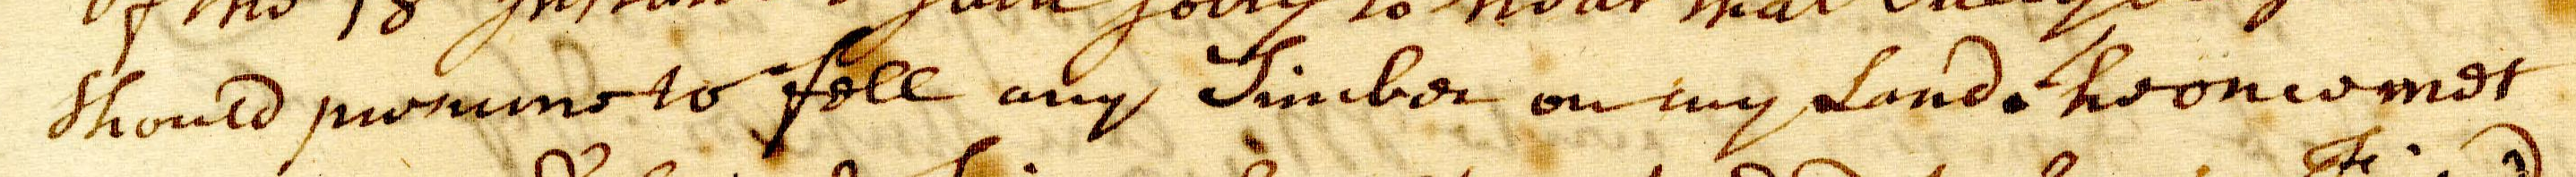Should presume to fell any Timber on my Land. he once met
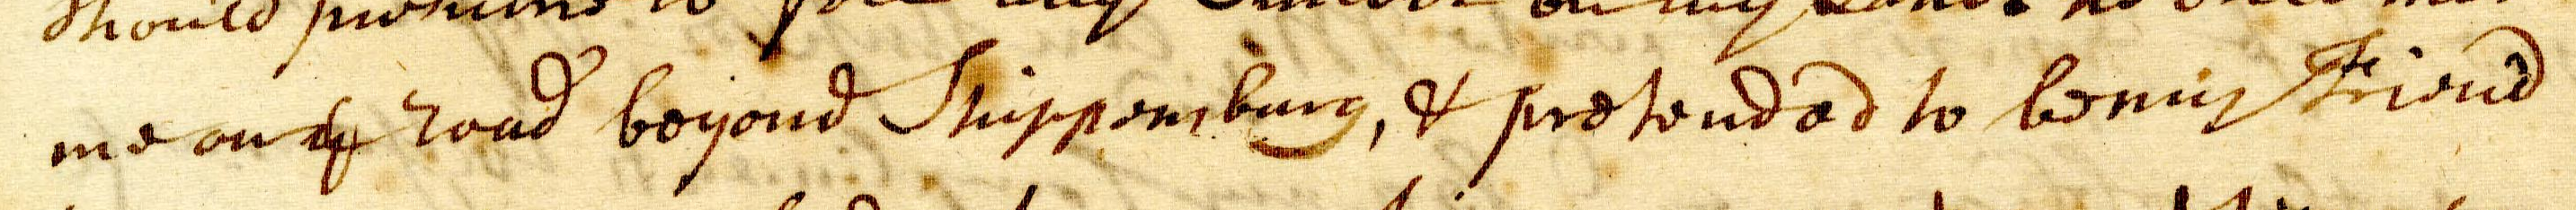me on y^e road beyond Shippensburg, & pretended to be my Friend
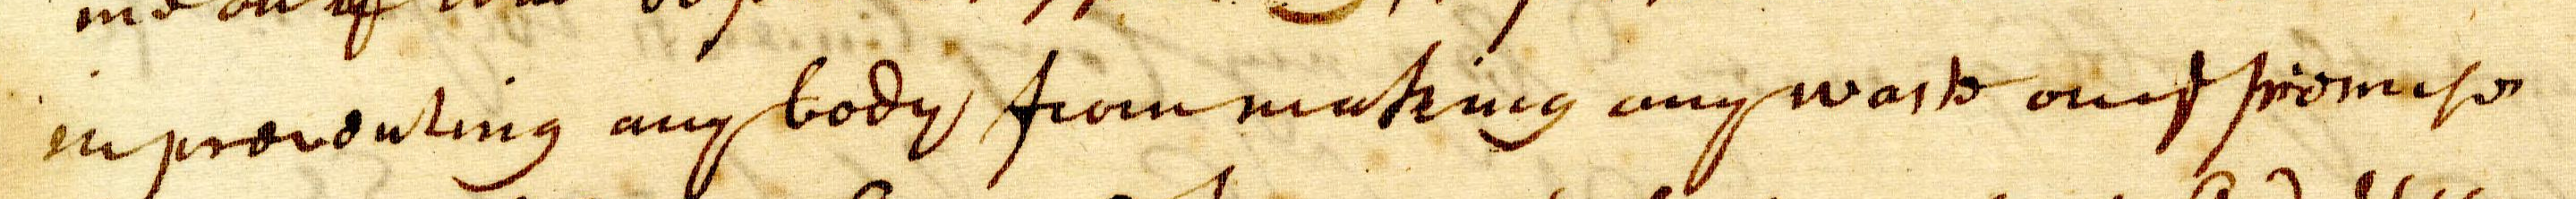in preventing any body from making any waste out of promises
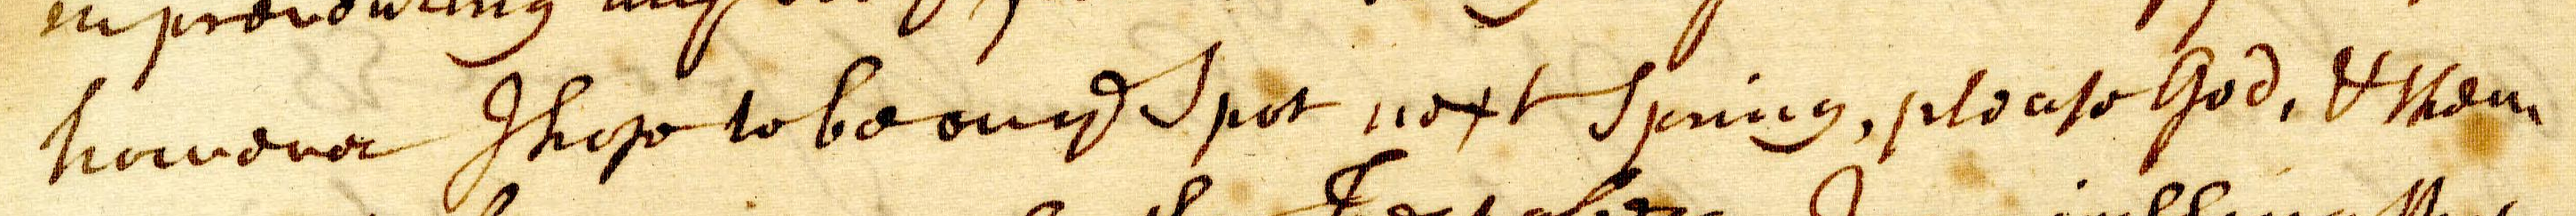however I hope to be on y^e Spot next Spring, please God, & then
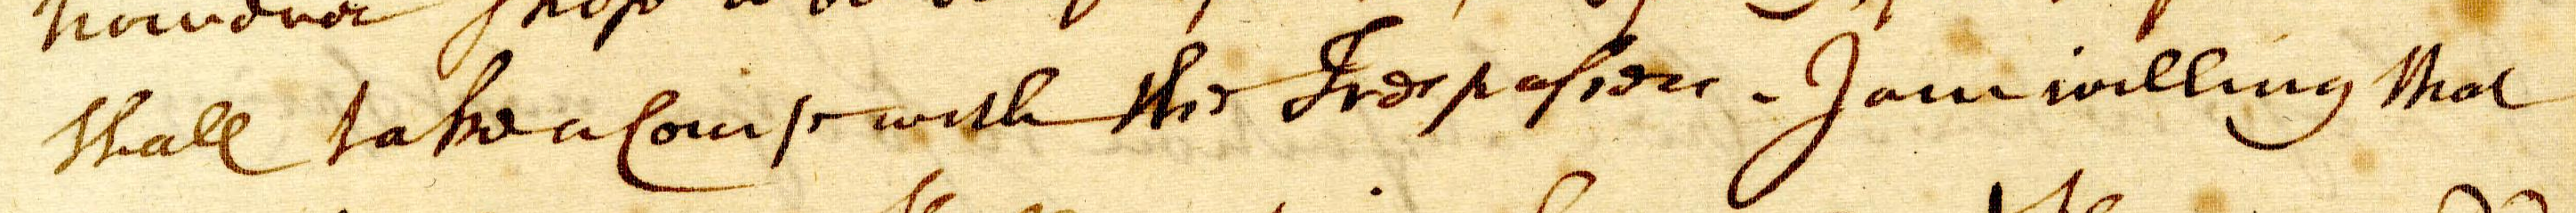Shall take a Course with the Trespassers. I am willing that
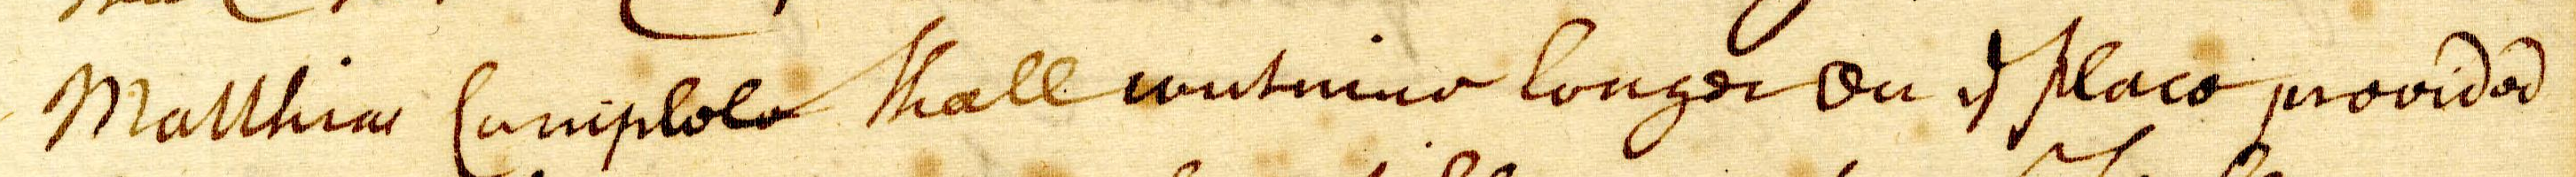Matthias Campbell shall continue longer on y^e place provided
